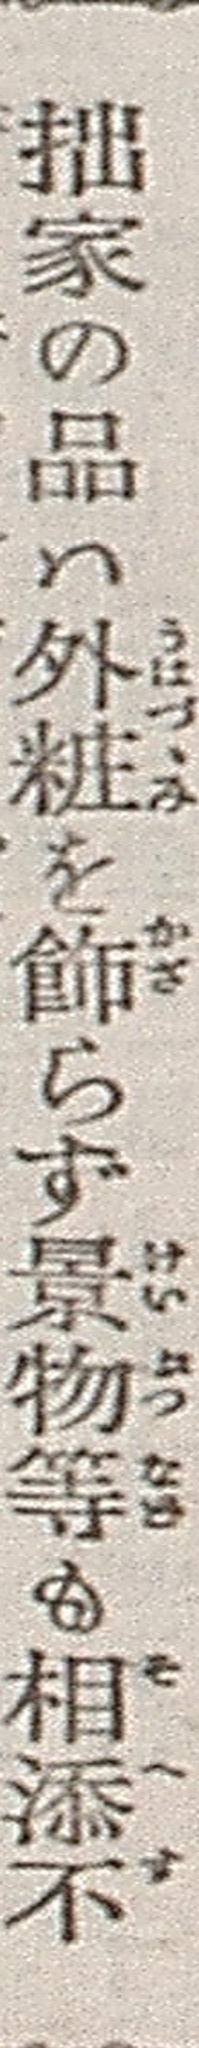拙家の品は外粧を飾らず景物等も相添不
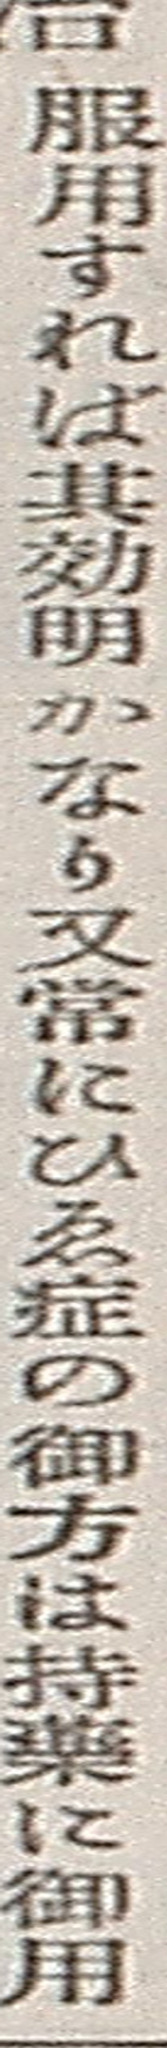治服用すれば其効用かなり又常にひゑ症の御方は特薬に御用
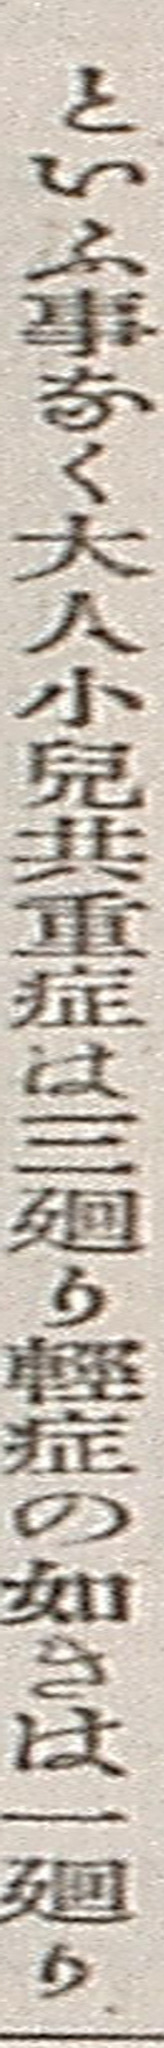といふ事なく大人小兒共重症は三廻り軽症の如きは一廻り
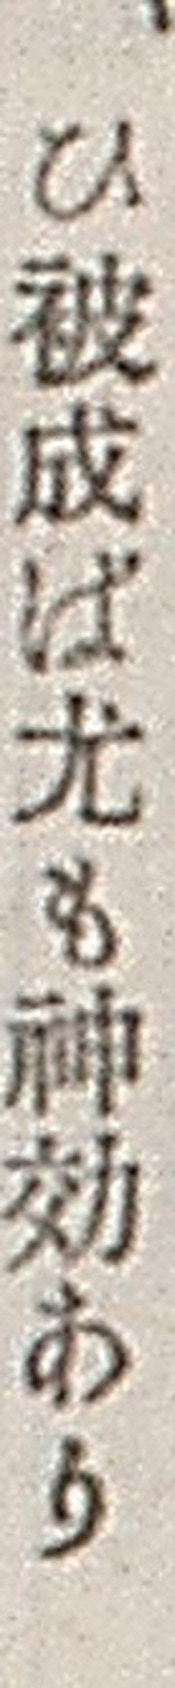ひ被成ば尤も神効あり
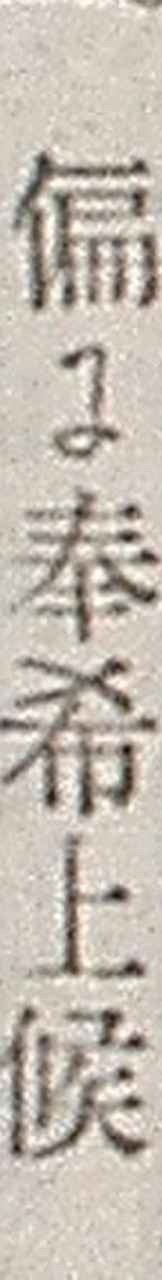偏に奉希上侯
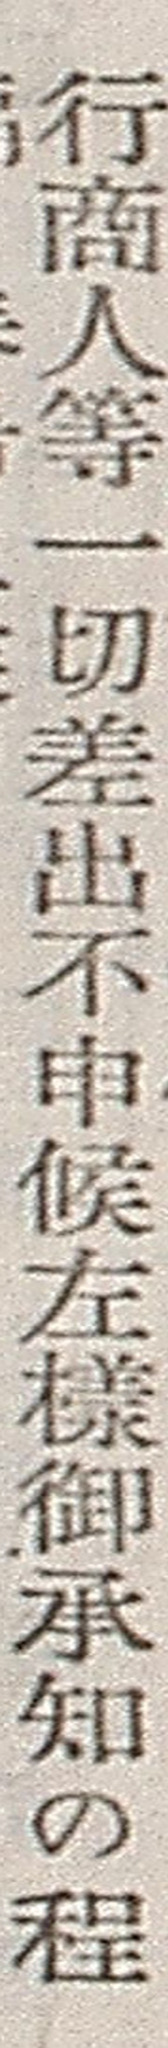行商人等一切差出不申候左様御承知の程
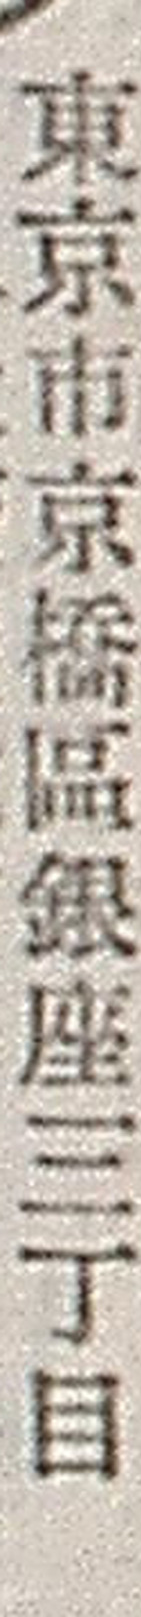東京市京橋區銀座三丁目
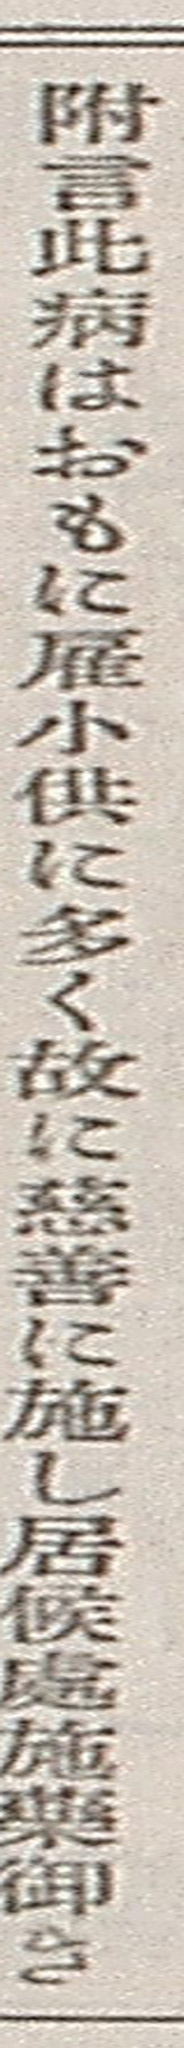附言此病はおもに雇子供に多く故に慈善に施し居候処施薬御き
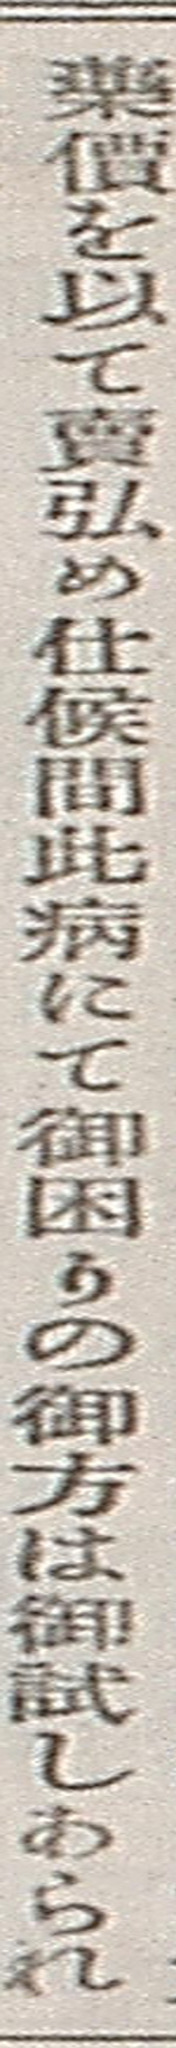薬価を以て売弘め仕候間此病にて御困りの御方は御試しあられ
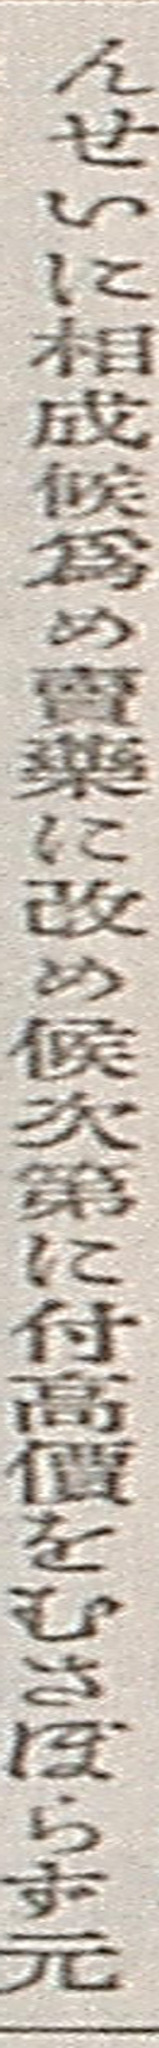んせいに相成候為め売薬に改め候次第に付高価をむさぼらず元
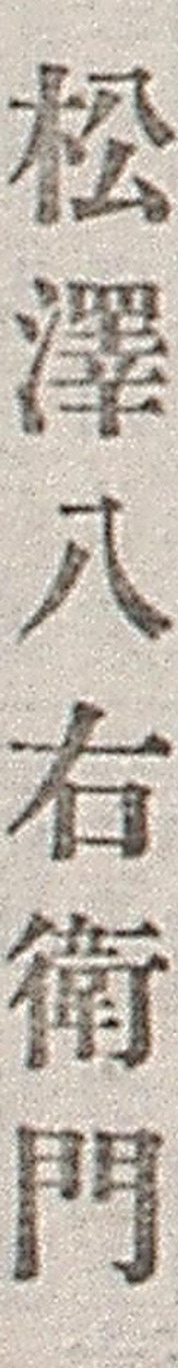松沢八右衛門
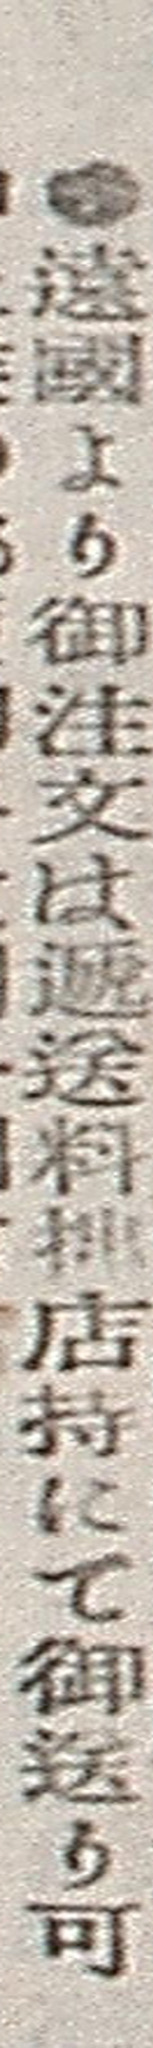●遠国より御注文は逓送料拙店持にて御送り可
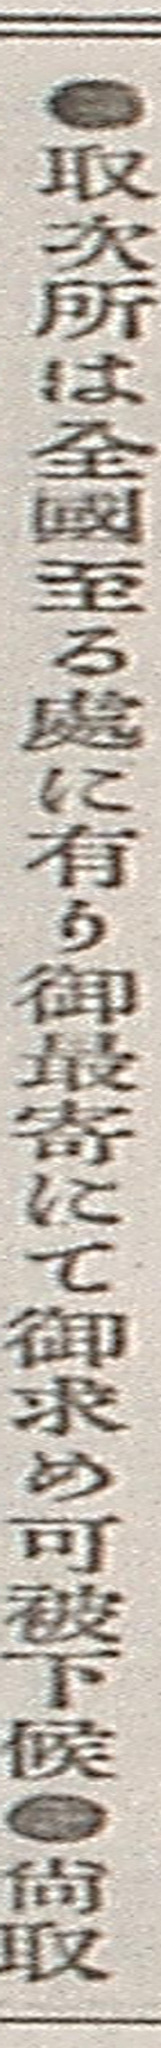●取次所は全国至る処に有り御最寄にて御求め可被下候●尚取
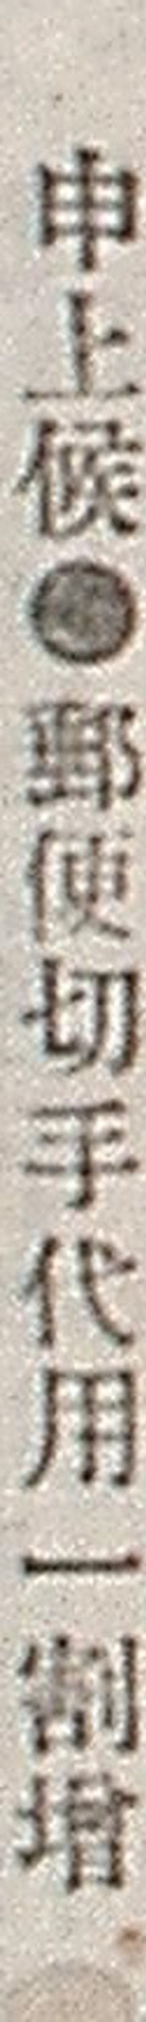申上候●郵便切手代用一割増
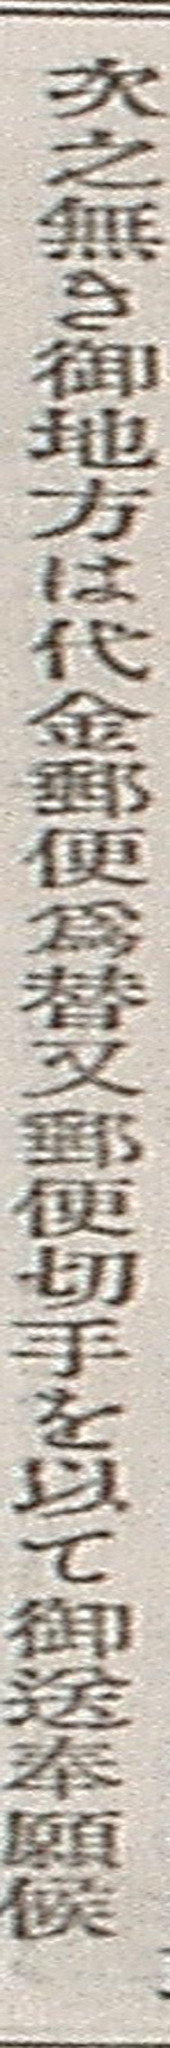次之無き御地方は代金郵便為替又郵便切手を以て御送奉願候

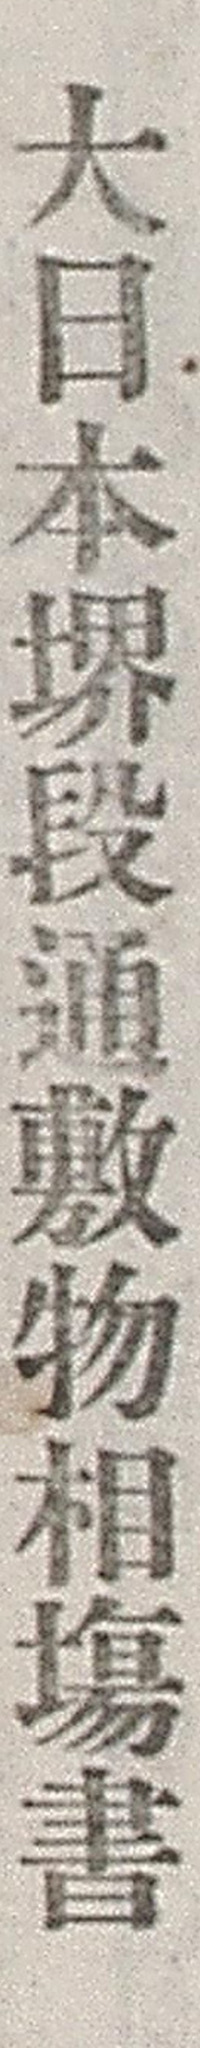大日本堺段通敷物相場書
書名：風俗畫報臨時増刊第百二十六號　洪水被害録（中）
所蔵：東京大学地震研究所図書室 Earthquake Research Institute Library, The University of Tokyo, JAPAN
